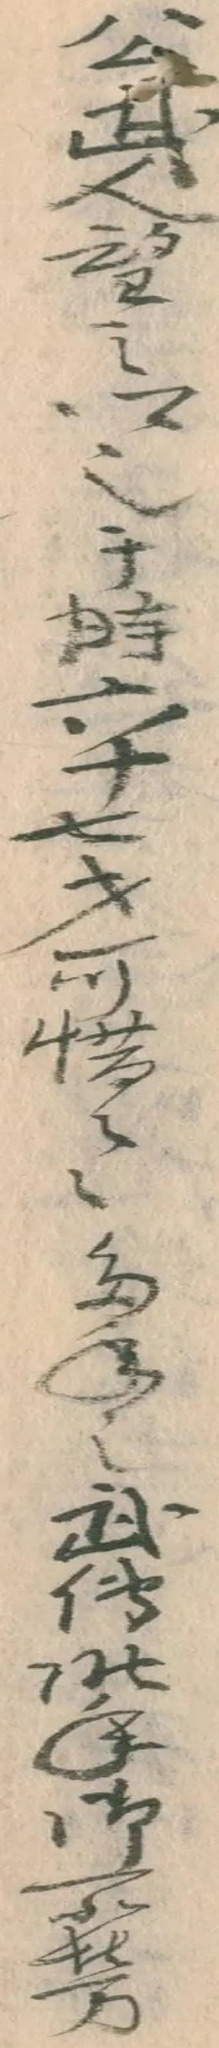公武人望之卿也于時六十七才可惜々々多年之武傳昨年御所労
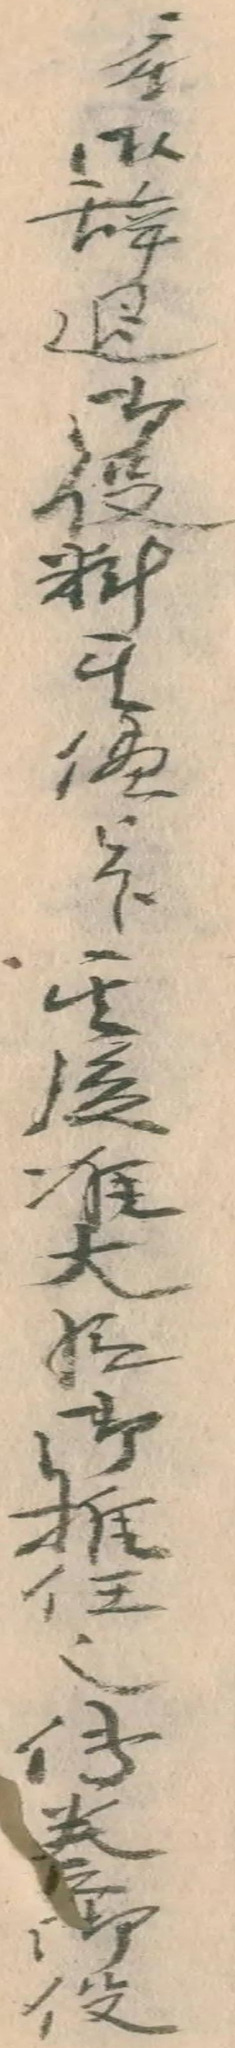ニ付御辞退御役料其侭被下其後准大臣御推任也傳奏御役
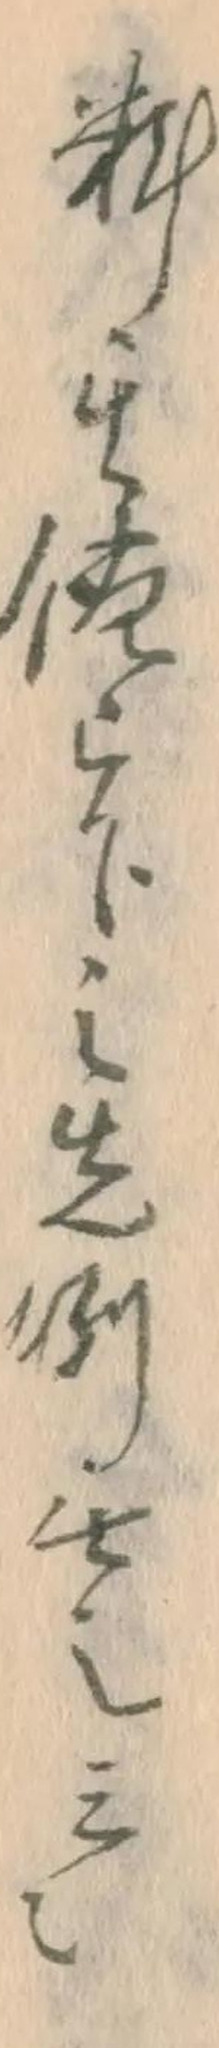料其侭被下之先例無之云々
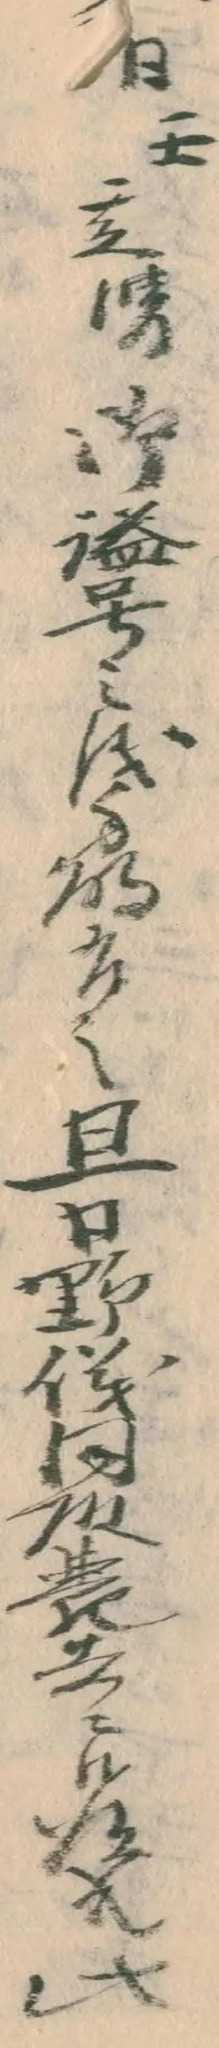八日壬亥晴御諡号之義手觸有之且日野儀同殿薨去ニ候得共此
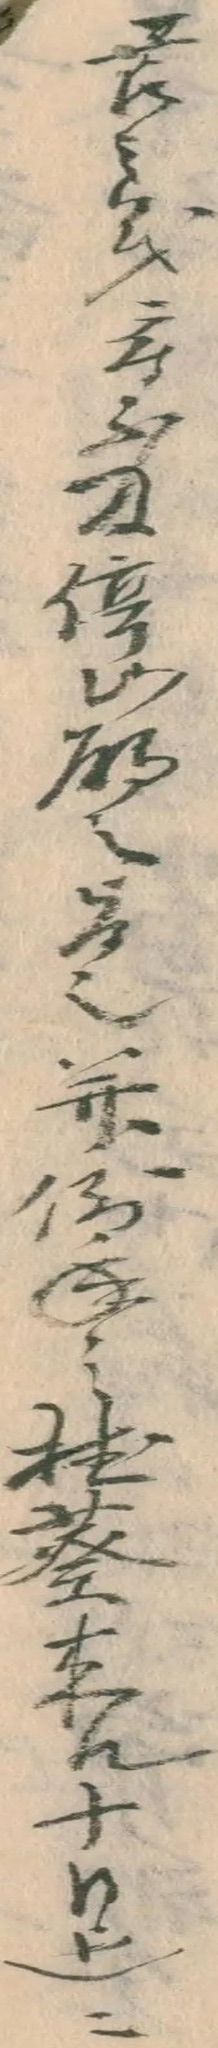節之義ニ付不及停止觸之旨也并例年之植葵来ル十日迄ニ
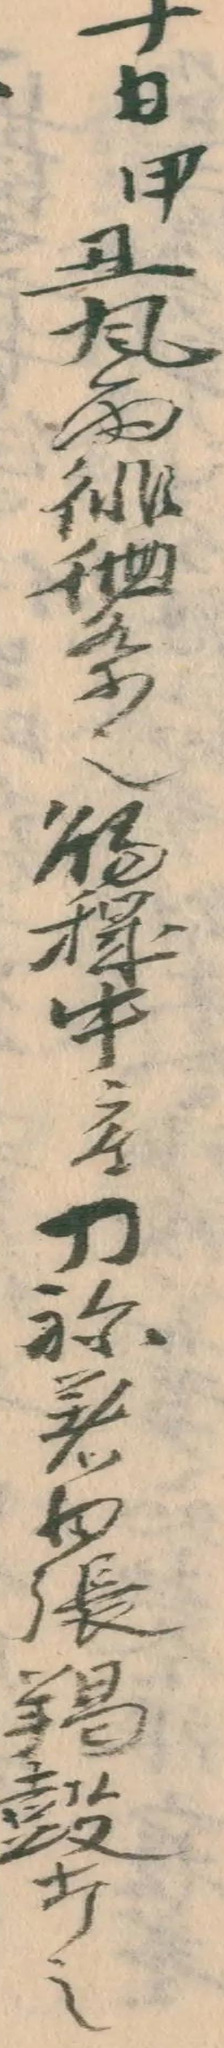十日甲丑風雨徘徊祭也触穢中ニ付刀祢着白張鞨鼓打之
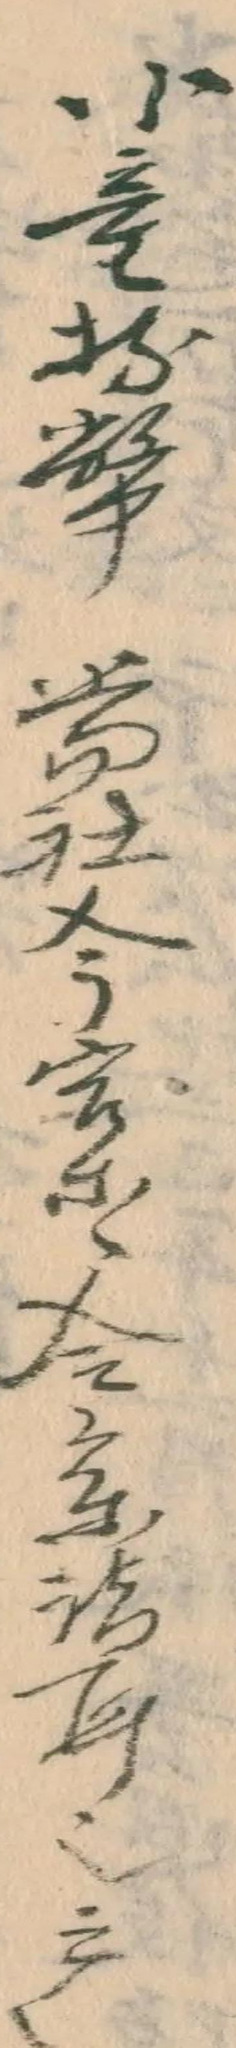小童持幣當社今宮等へ合参詣耳也云々
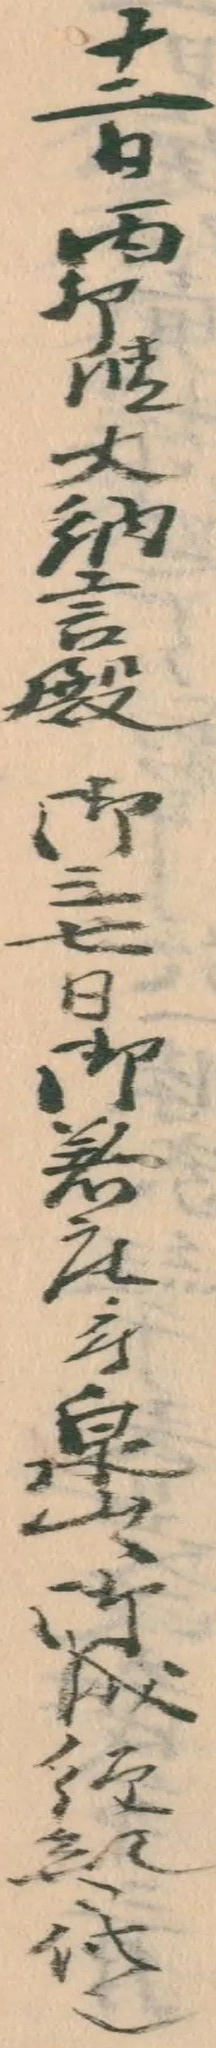十二日丙卯晴大納言殿御三七日御着座ニ付泉山へ御成経紀御供也
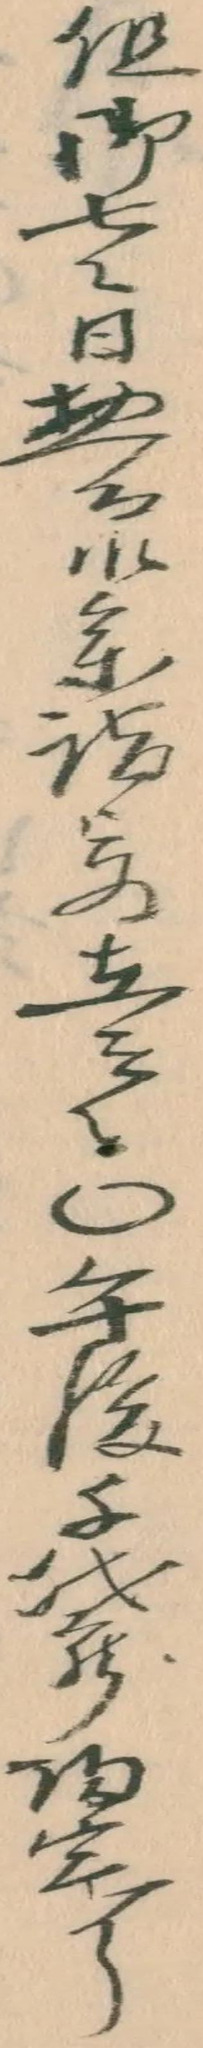但御七々日惣而水参詣被為在云々〇午後千代蔵帰宅了
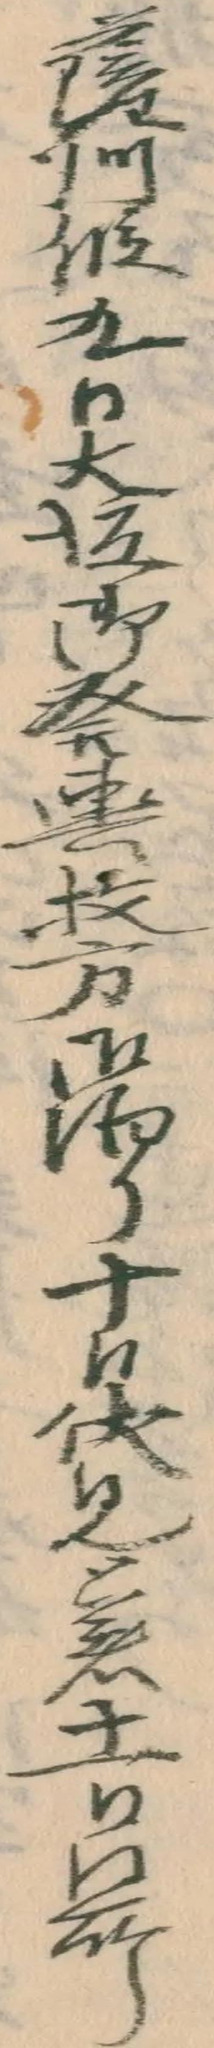薩州殿九日大坂御発輿枚方御泊リ十日伏見御着十一日同所
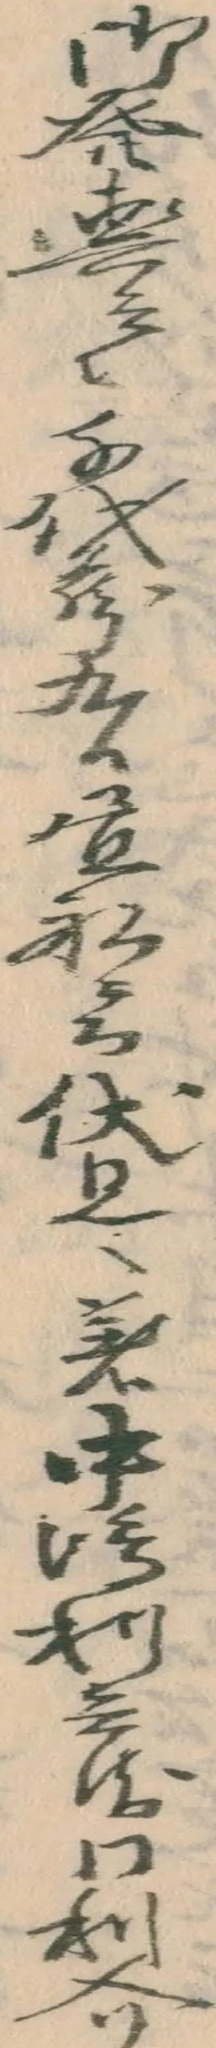御発輿云々千代蔵九日昼舩二而伐見へ着中嶋利兵衛同利介
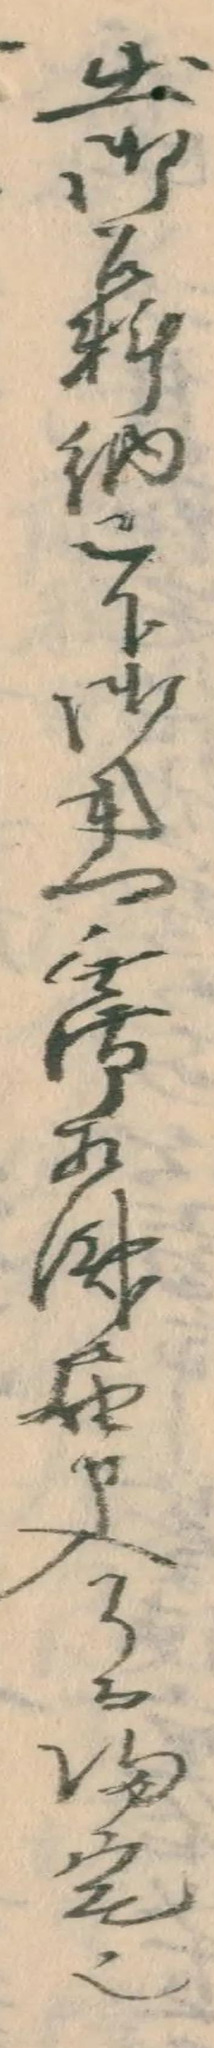出御召料納已下御用向無滞相済候申入了而帰宅也
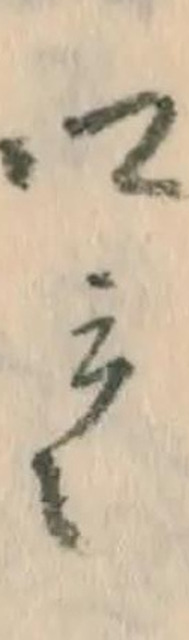卿云々
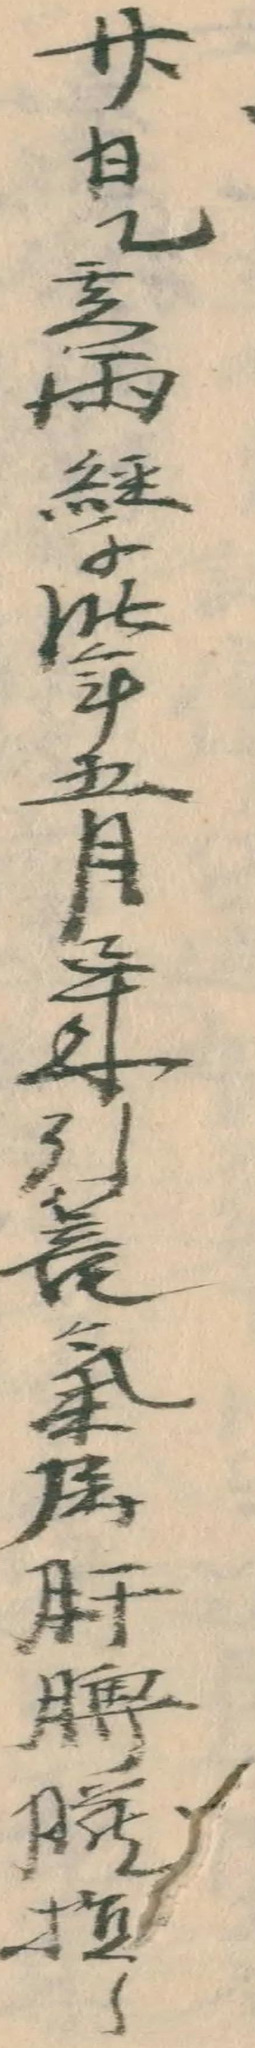廿日乙亥雨経千昨年五月已来引篭氣屈肝臍臓損し
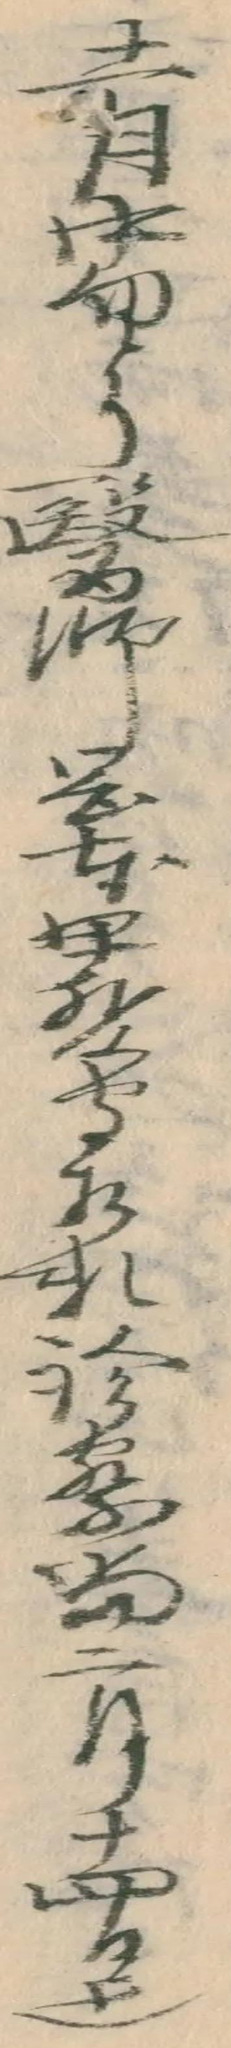十一月中旬より醫師岡本甲斐守相頼診察當二月十四日迄
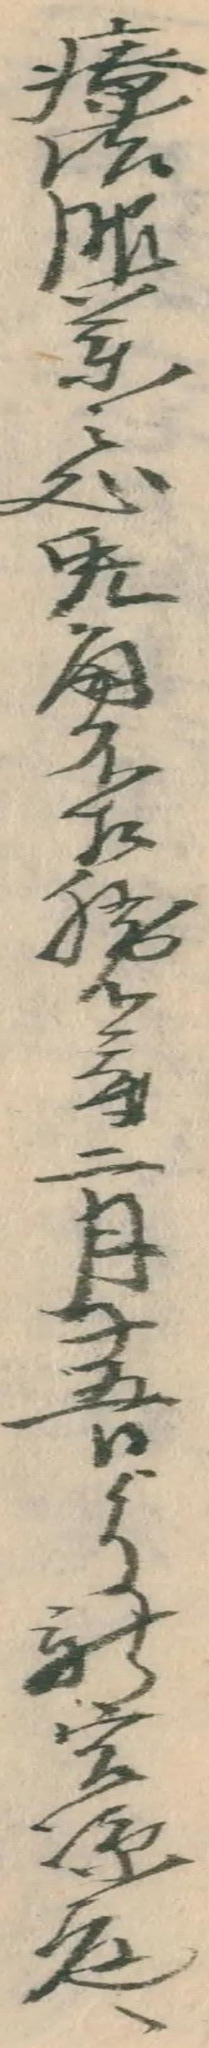療治服薬之処宛角不相勝候ニ付二月十五日より新宮涼庭へ
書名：賀茂社記録. 第70冊
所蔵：国立国会図書館 National Diet Library, JAPAN
